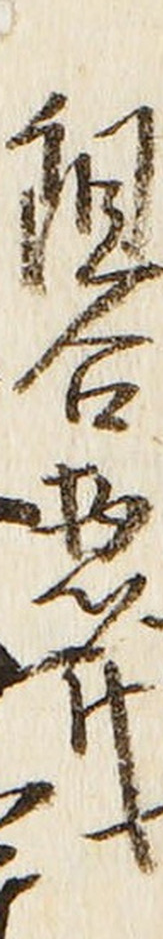組合惣代
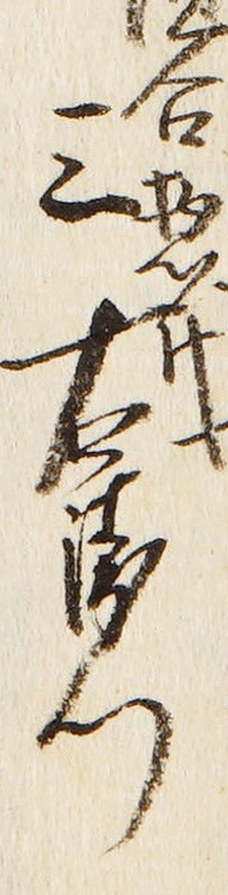三右衛門
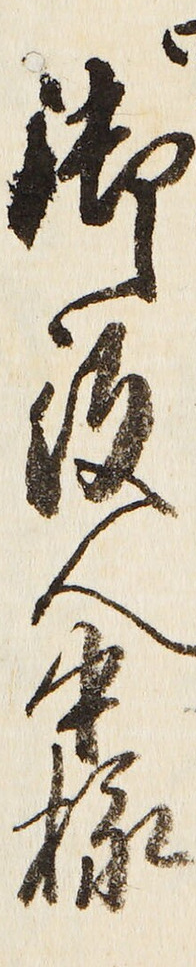御役人中様
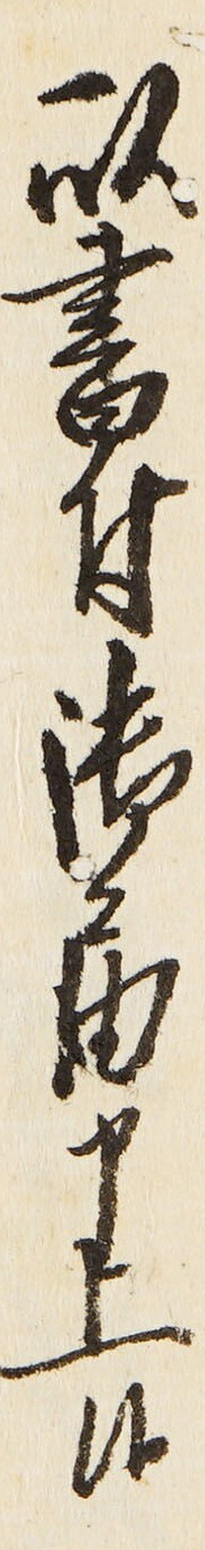以書付御届申上候
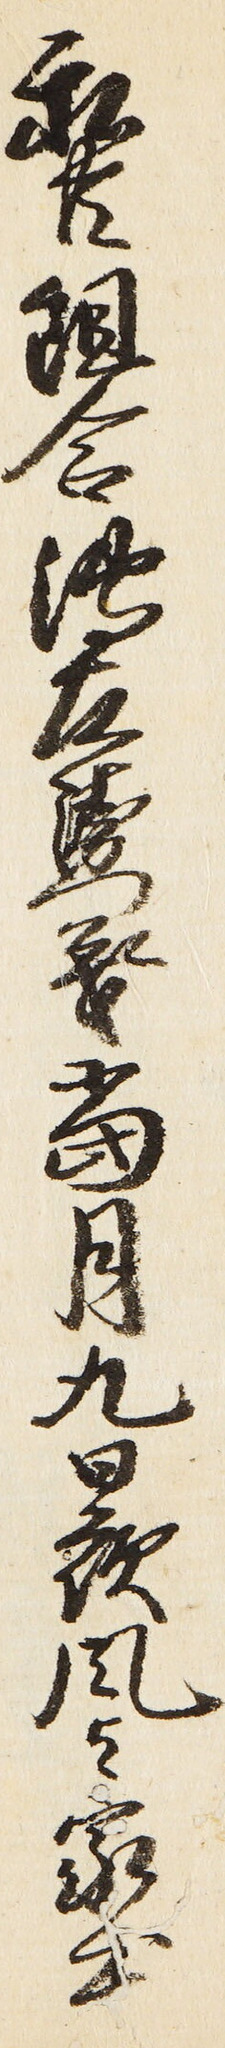一私共組合伝左衛門義当月九日夜風与家出
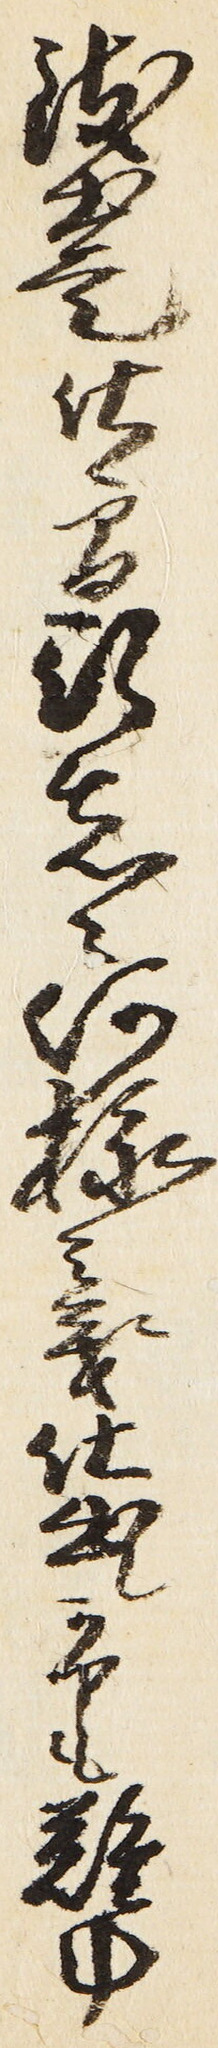致出走仕候間行先ニ何様之義仕出し可申も難計
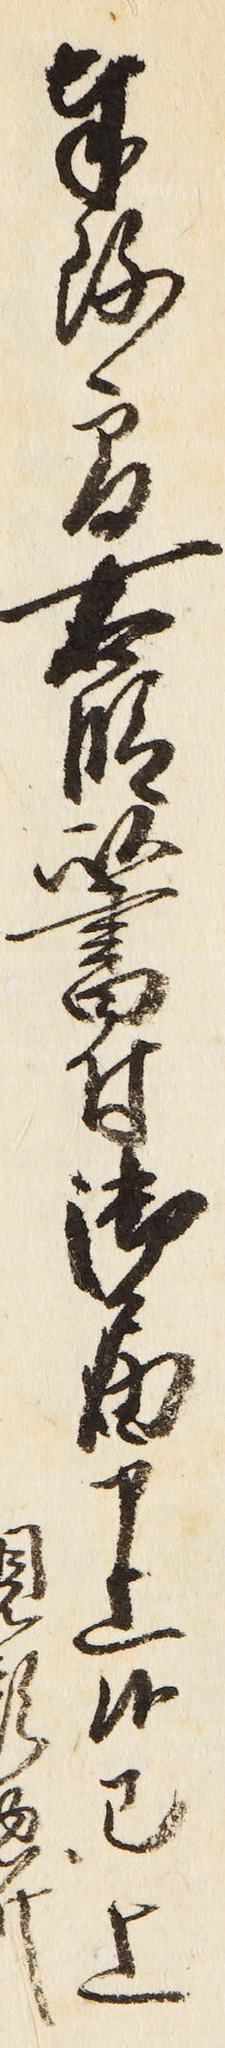奉存候間右段以御書付御届申上候已上
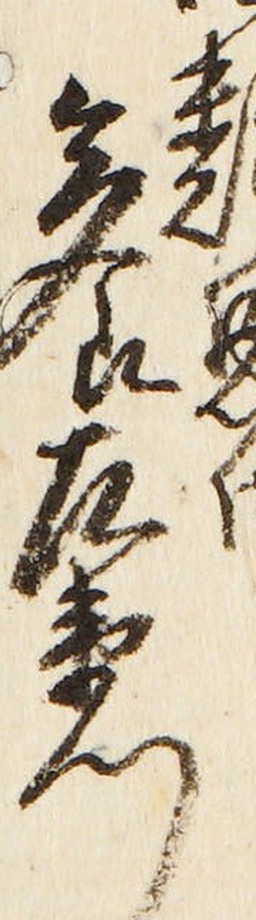多郎左衛門
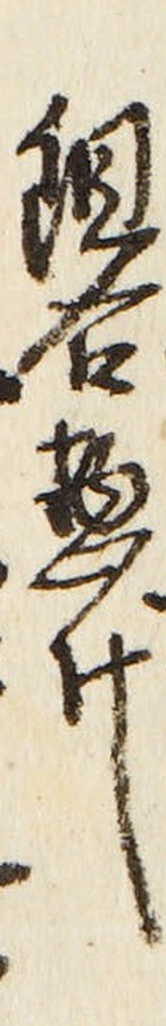組合惣代
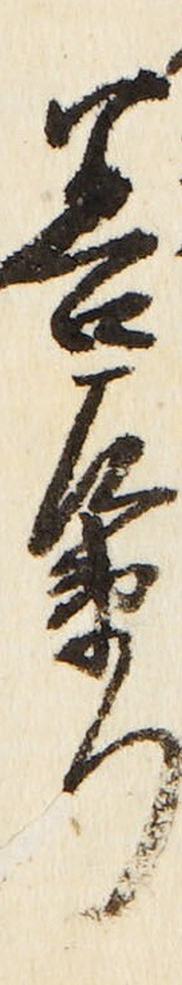善左衛門
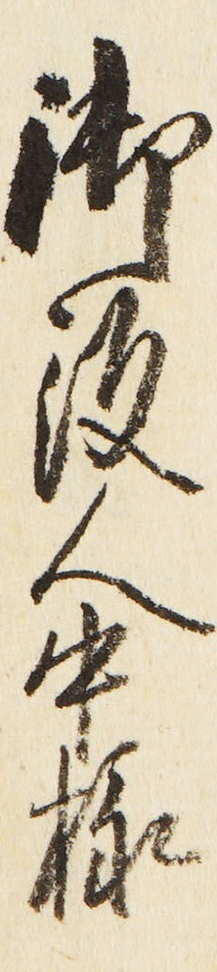御役人中様

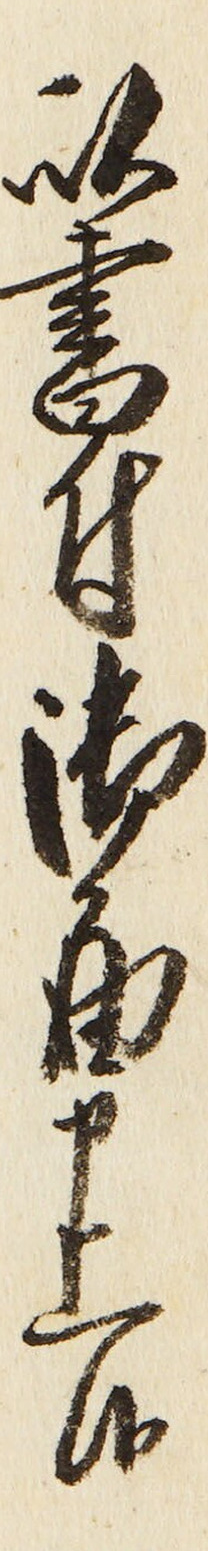以書付御届申上候
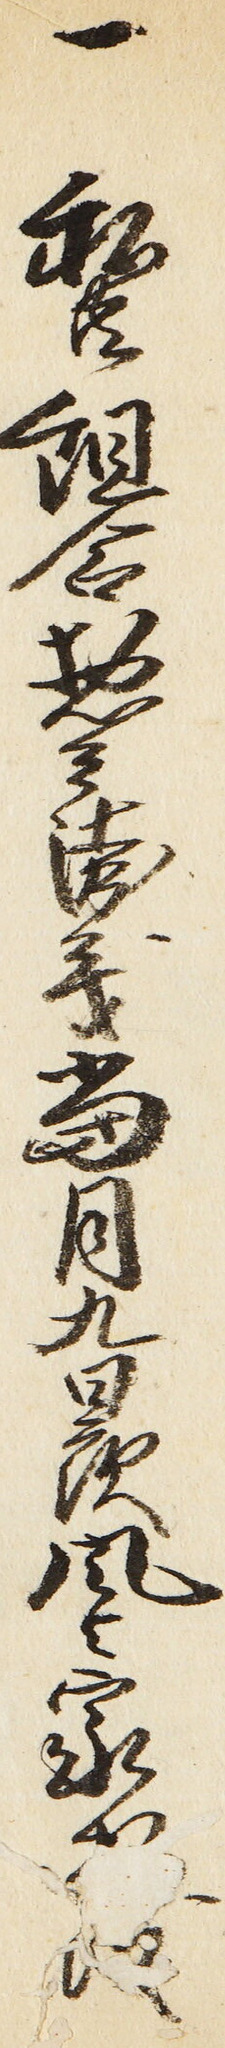一私共組合惣兵衛義当月九日夜風与家出致
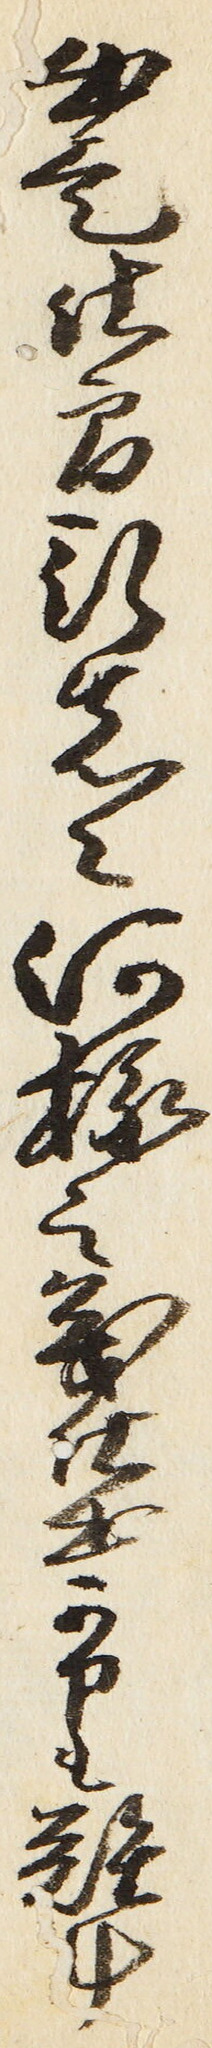出走仕候間行先ニ何様之義仕出可申も難計
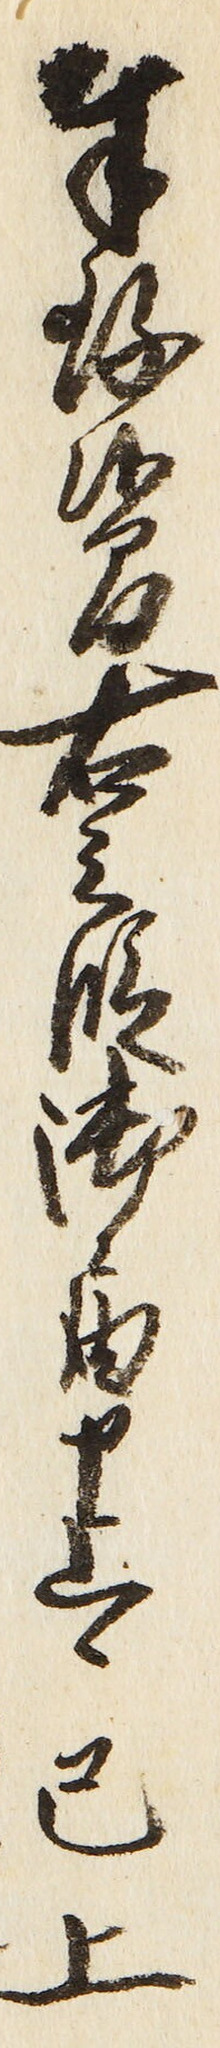奉存候間右之段御届申上候已上
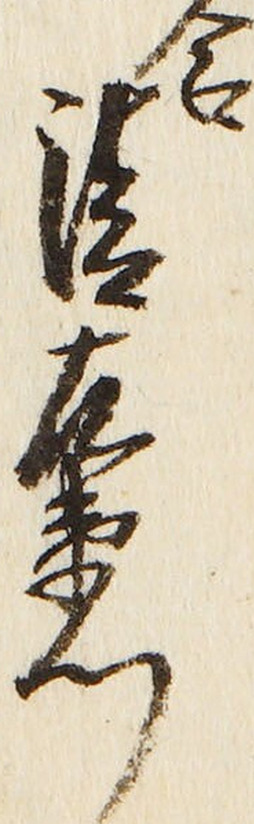清左衛門
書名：難船一件記録
